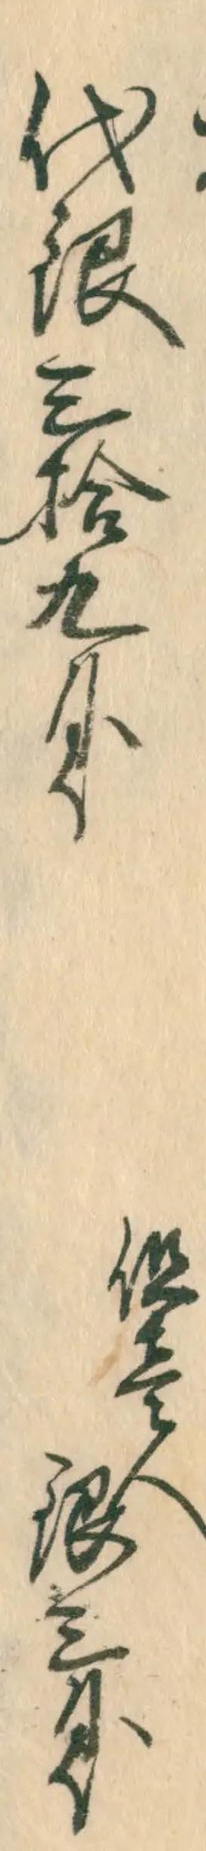代銀三拾九匁但壱人銀三匁
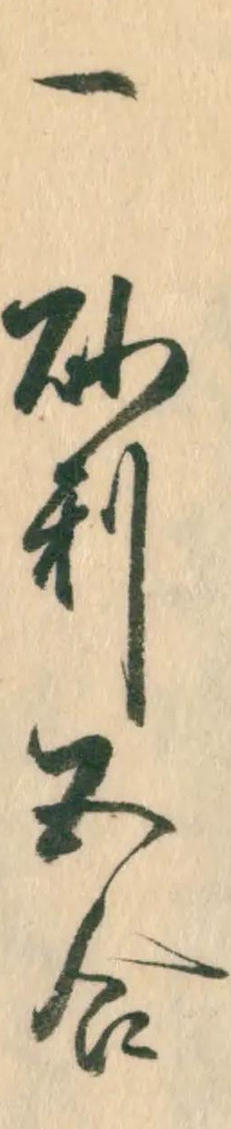一砂利五合
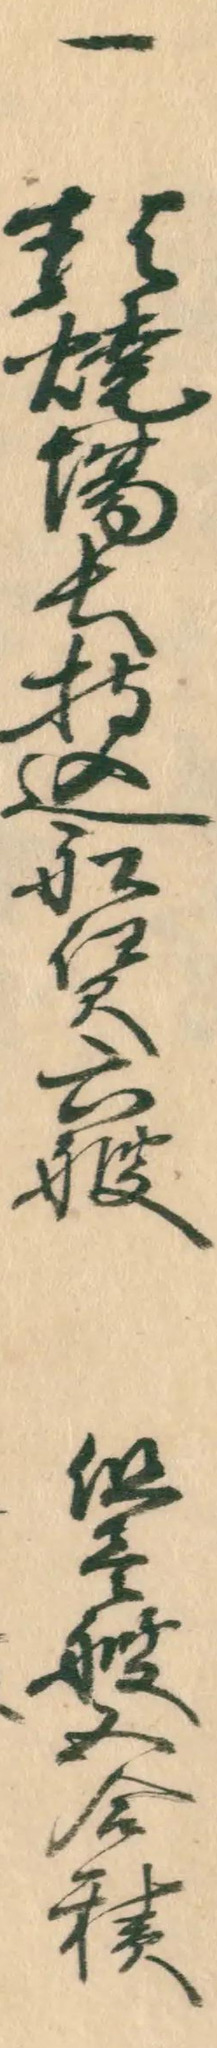一類焼場土持込船賃六艘但壱艘五合積
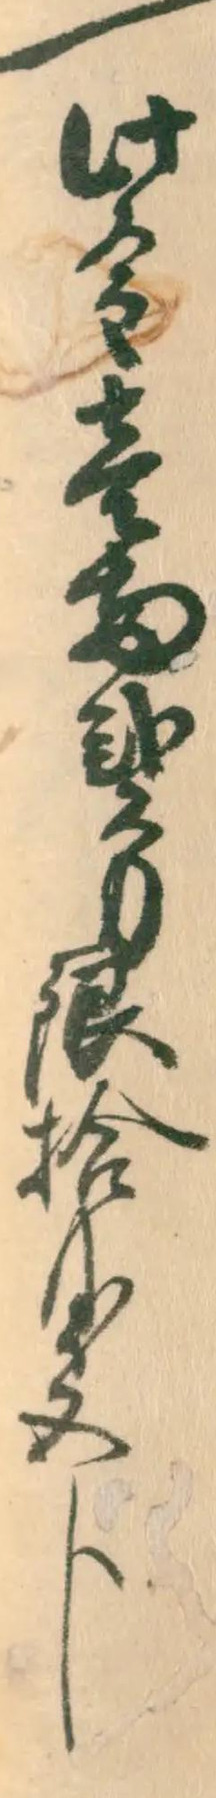此金壱両弐分銀拾匁五分
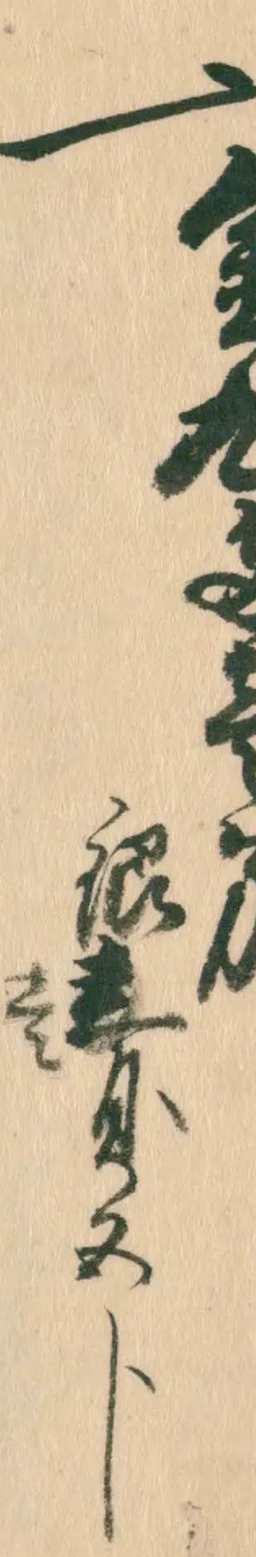銀壱匁五分
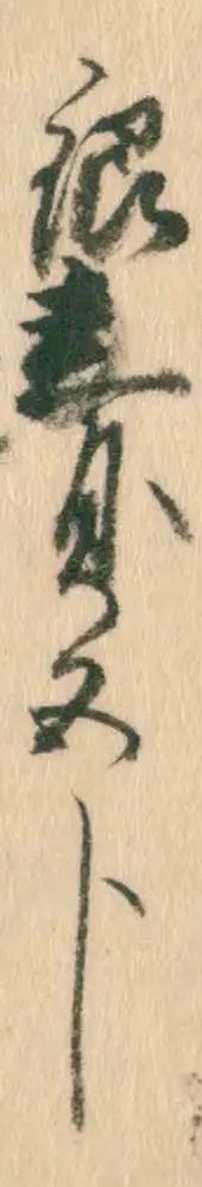銀壱匁五分
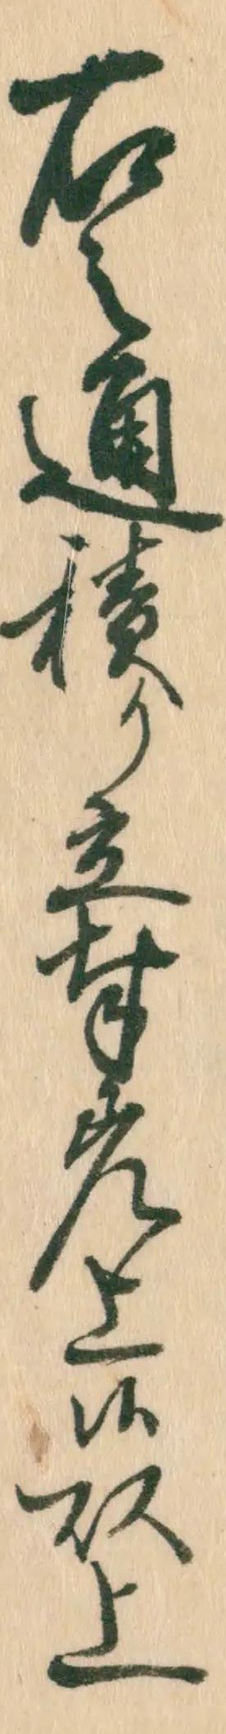右之通積り立奉差上候以上
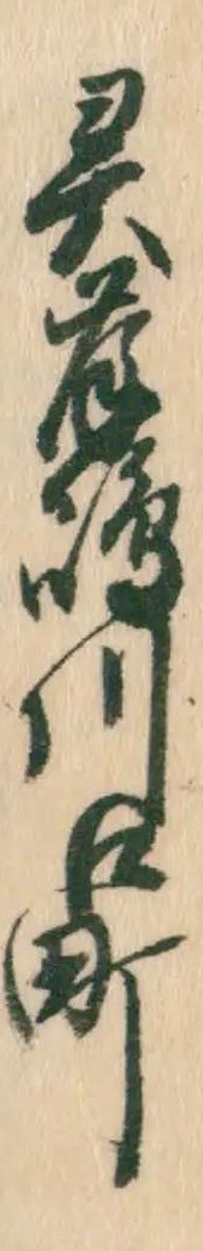卯霊岸島川口町

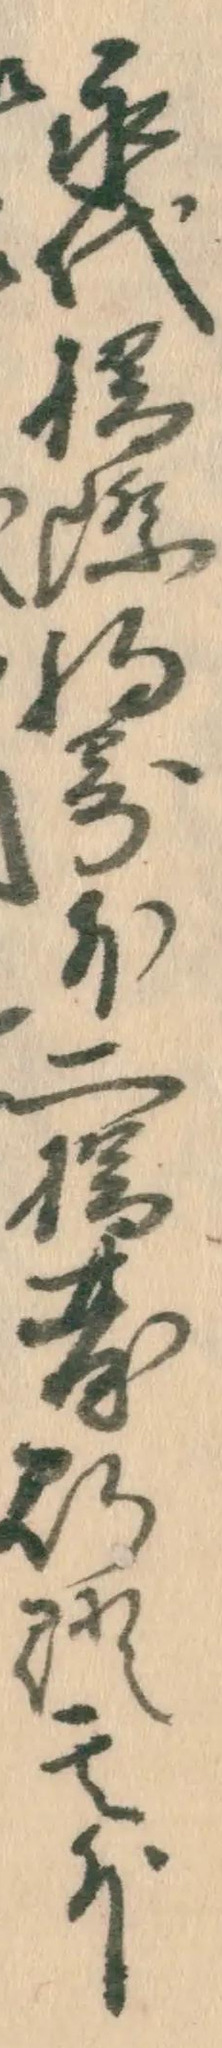永代橋際駒寄外二橋台行灯其外
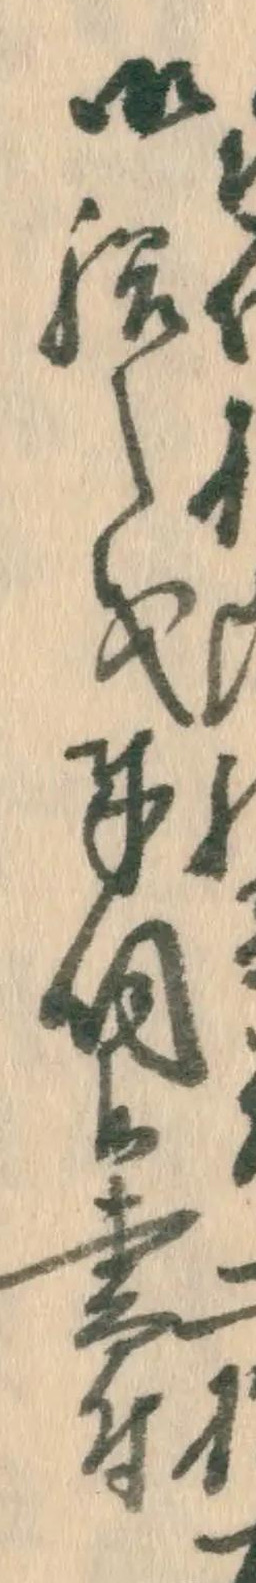御繕之義奉伺候書付
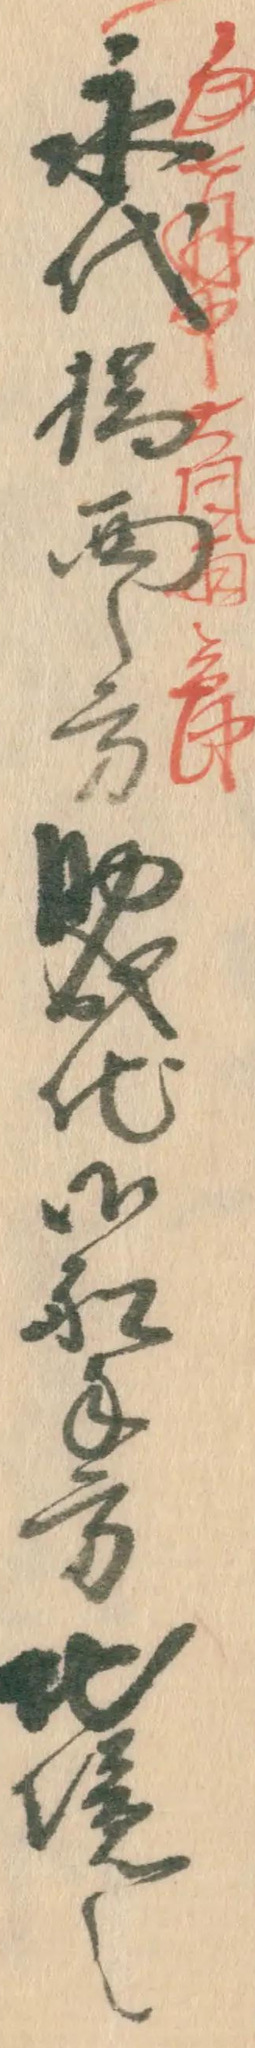永代橋西之方助成地御船手方地境之
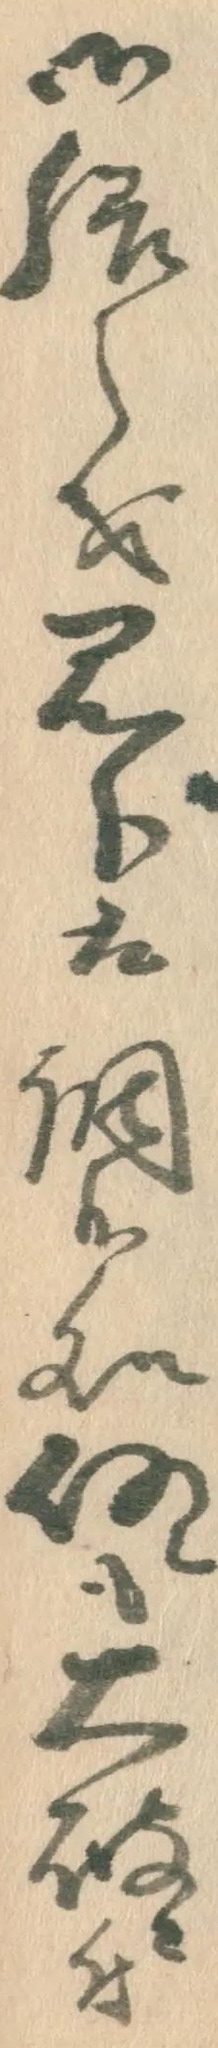御繕之義見分取調候処何レも大破ニ付

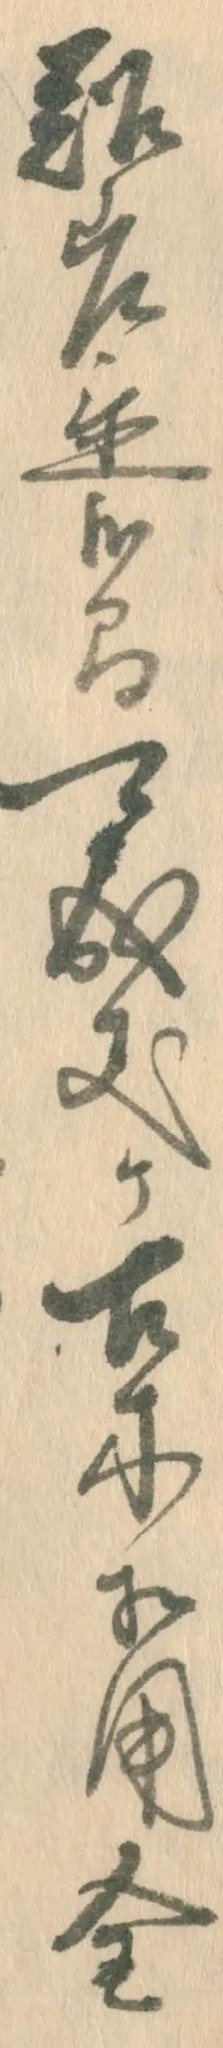難差置候間可成丈ケ古木相用全
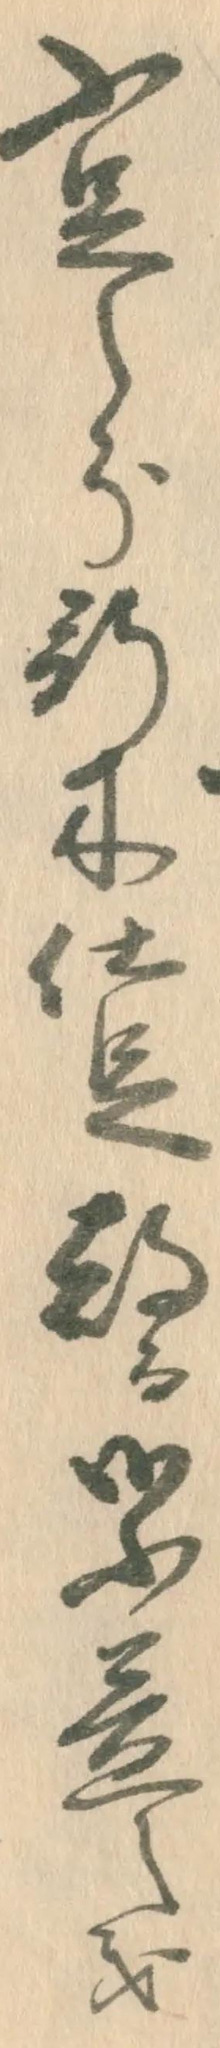不足之分新木仕足都而御不益之義
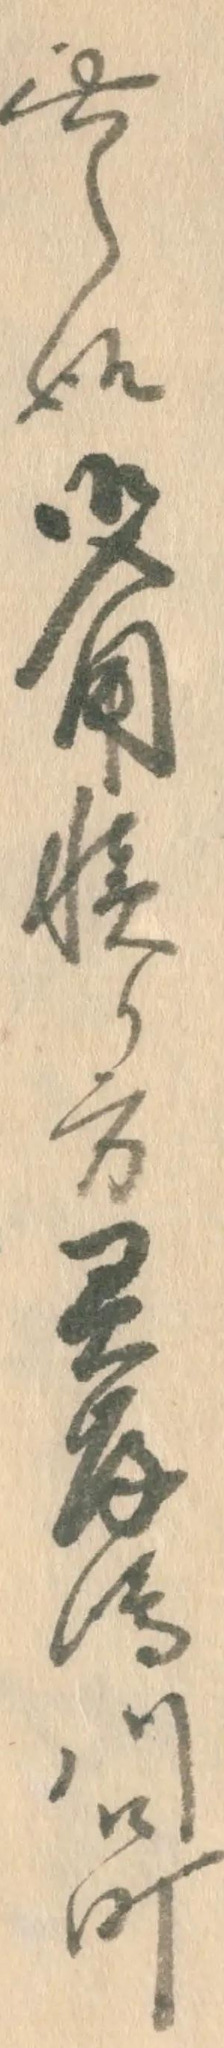無之様御入用積り方霊岸島川口町
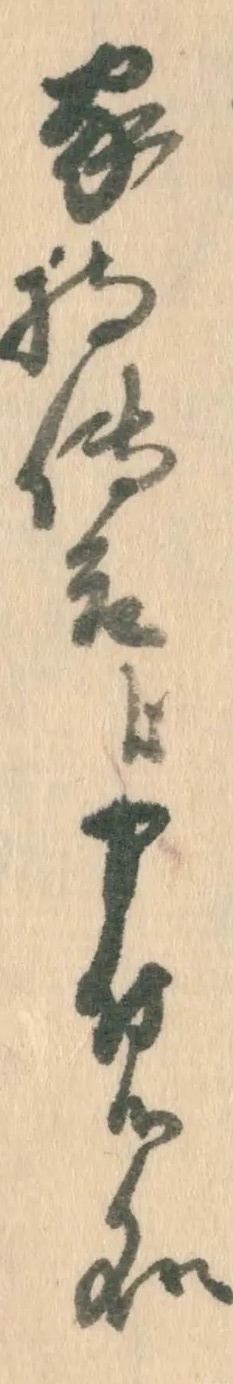家持伝吉え申付候処
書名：三橋 17巻. [8] 三橋小破御修復書留　但御奉行御掛リ替地震潰橋番屋　嘉永四亥年より安政二卯年迄　下
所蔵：国立国会図書館 National Diet Library, JAPAN
